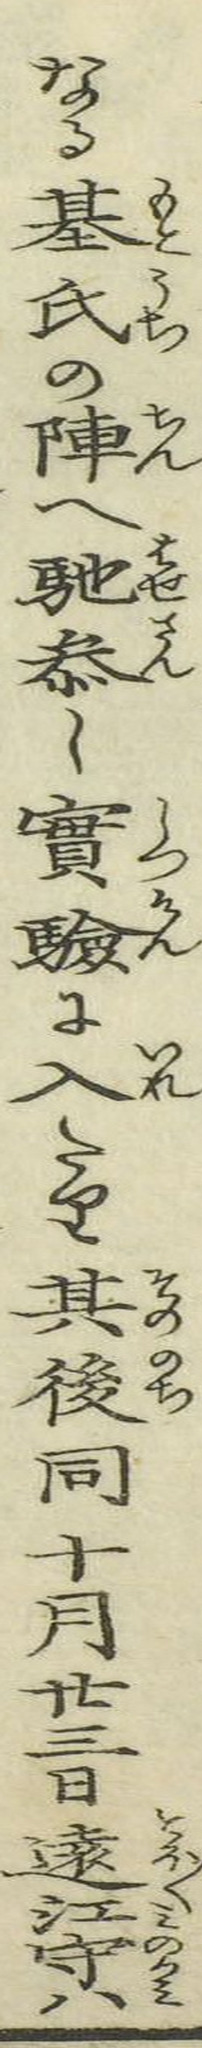なる基氏の陣へ馳参し實驗に入たり其後同十月廿三日遠江守は
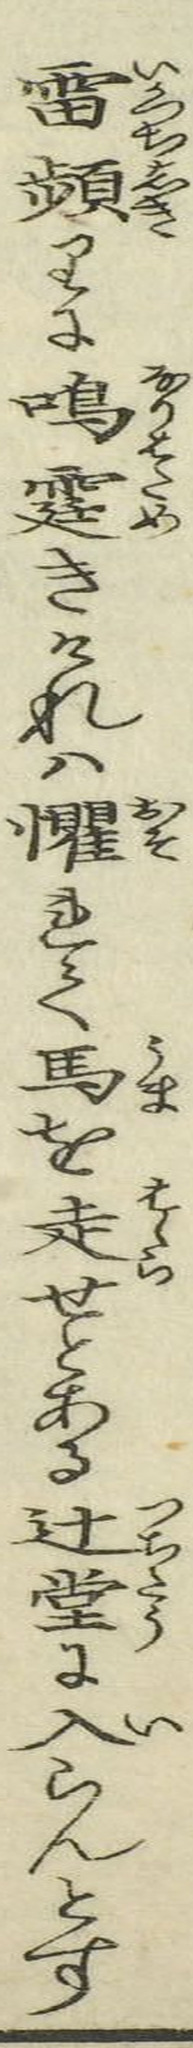雷頻りに鳴霆きけれは懼れて馬を走せとある辻堂に入らんとす
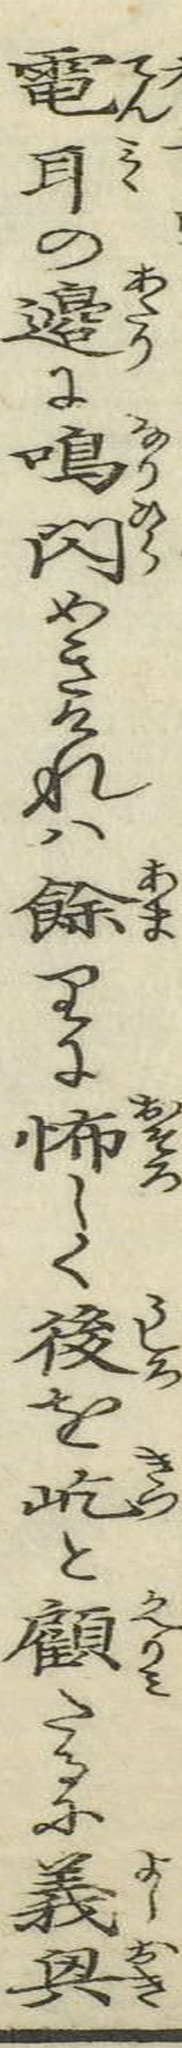電耳の邉に鳴閃めきけれは餘りに怖しく後を屹と顧たるに義興
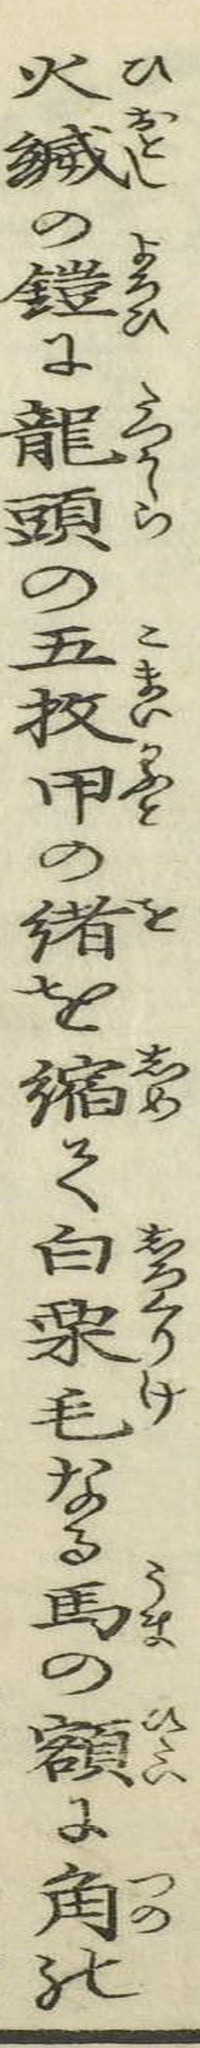火縅の鎧に龍頭の五枚甲の緒を縮て白栗毛なる馬の額に角の
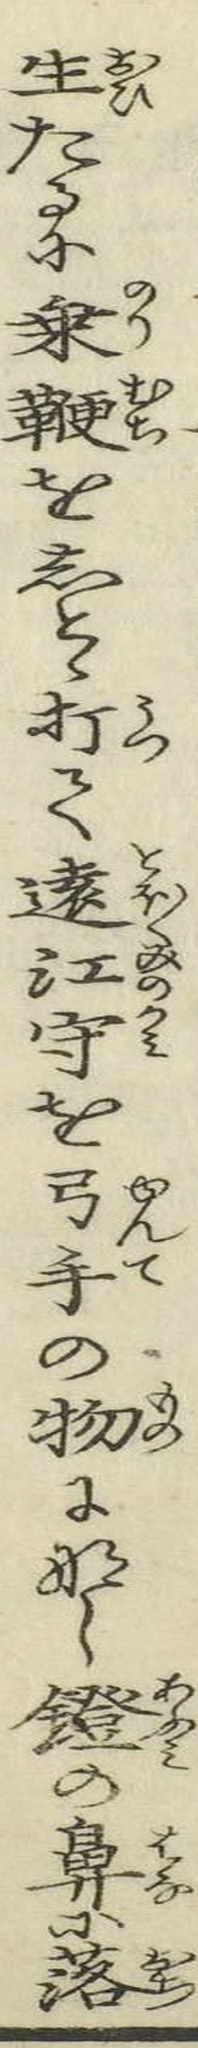生たるに乗鞭をしとゝ打て遠江守を弓手の物になし鐙の鼻に落
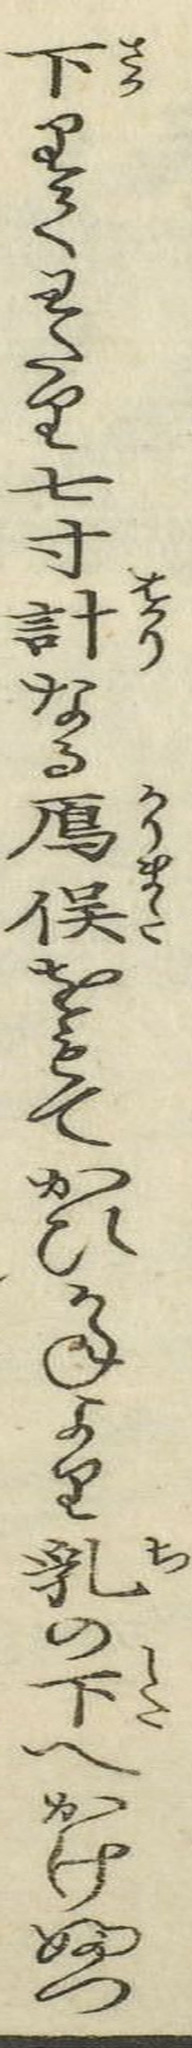下りてわたり七寸計なる鳫俣をもてかひかねより乳の下へかけふつ
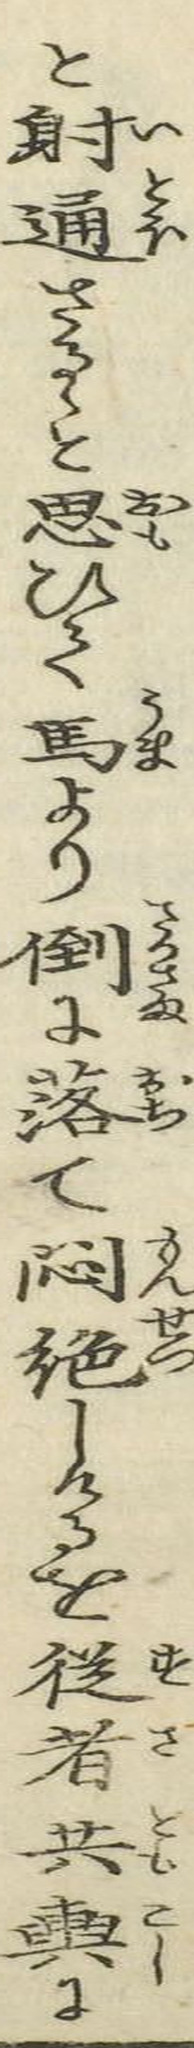と射通さるゝと思ひて馬より倒に落て悶絶しけるを従者共輿に
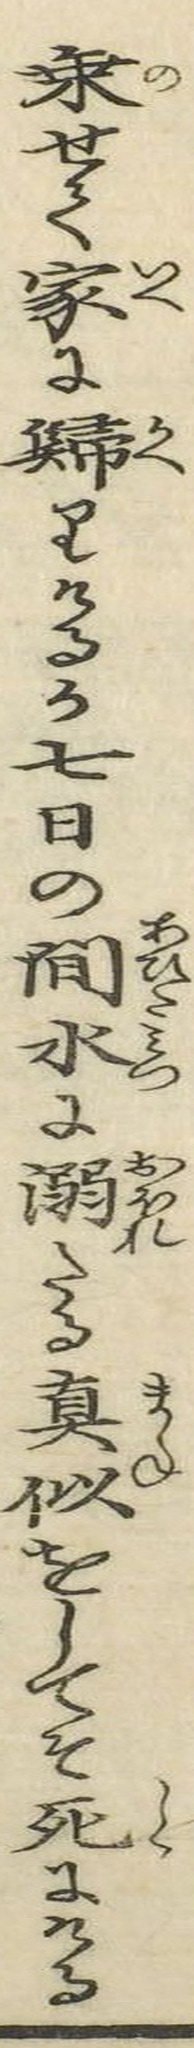乗せて家に歸りけるか七日の間水に溺たる真似をしてそ死にける
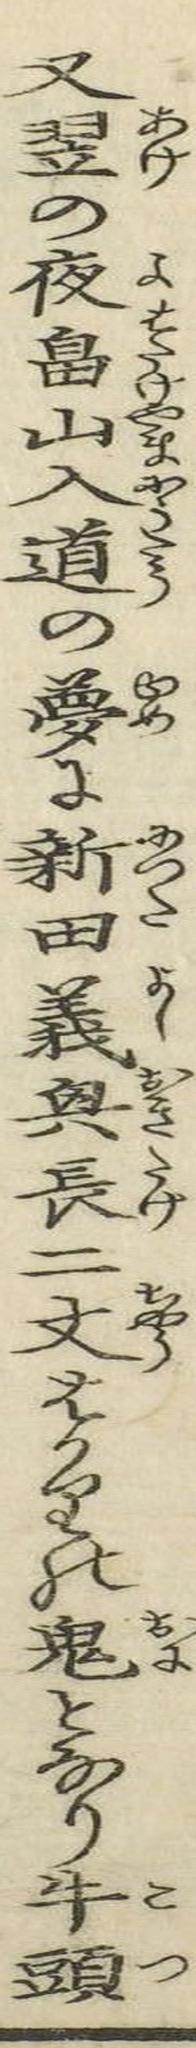又翌の夜畠山入道の夢に新田義興長二丈はかりの鬼となり牛頭
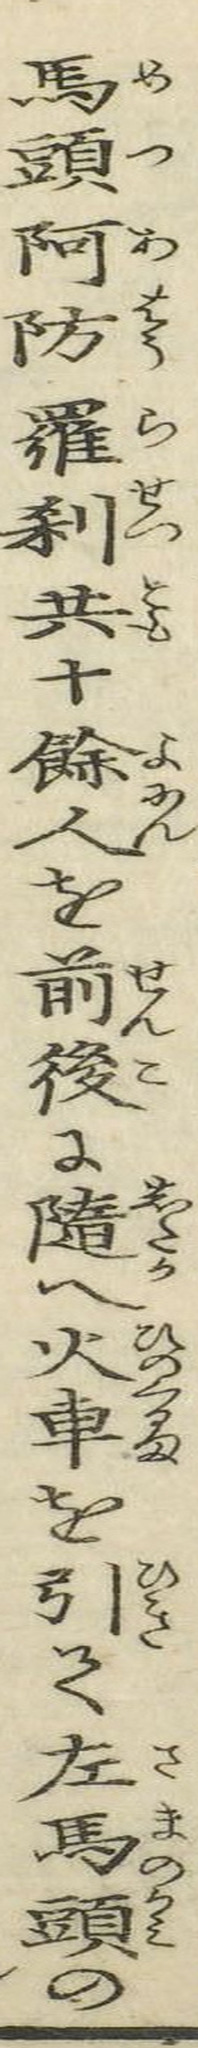馬頭阿防羅刹共十餘人を前後に隨へ火車を引て左馬頭
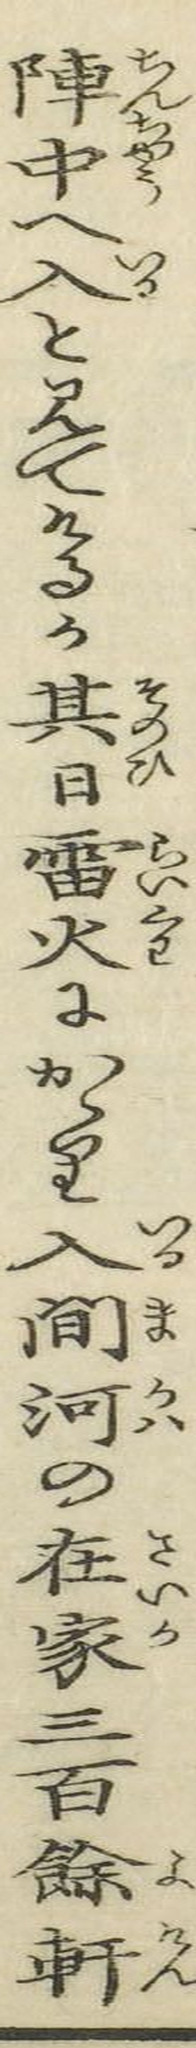陣中へ入と見てけるか其日雷火にかゝり入間河の在家三百餘軒
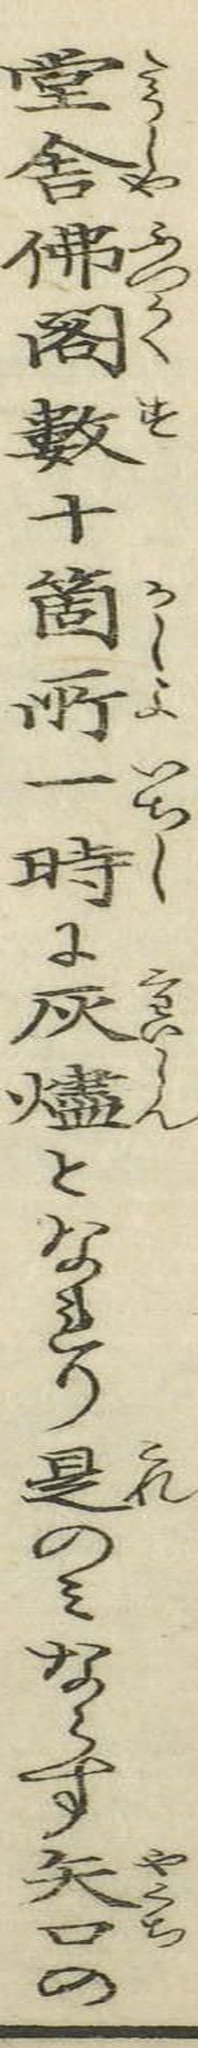堂舎佛閣數十箇所一時に灰燼となれり是のみならす矢口の
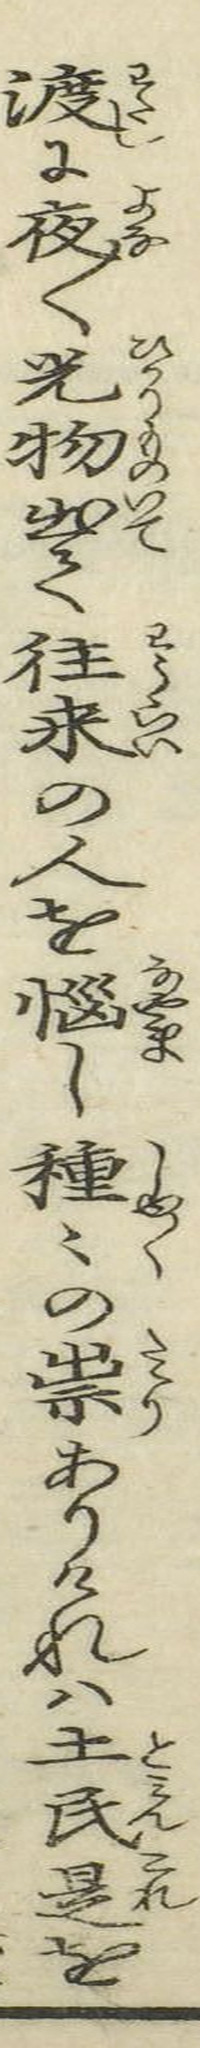渡夜〳〵よな光物出て往来の人を惱し種々の祟ありけれは土民是を
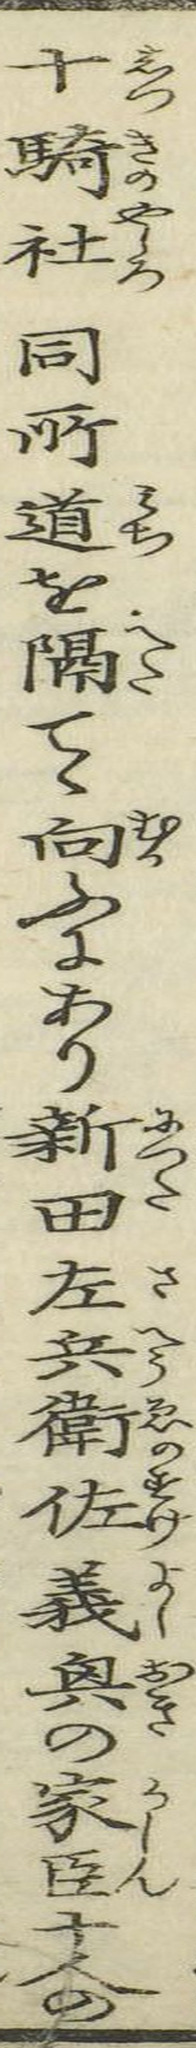十騎社同所道を隔てゝ向ふにあり新田左兵衛佐義興の家臣十人の
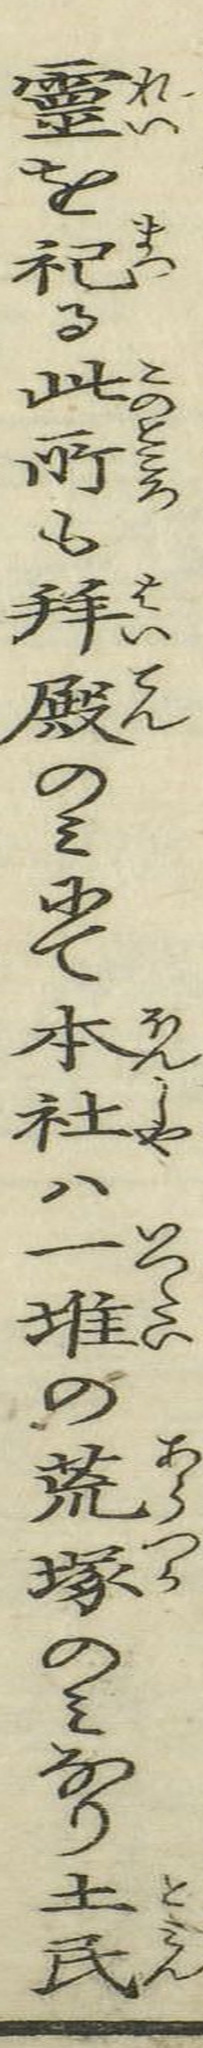靈を祀る此所も拜殿のみにて本社は一堆の荒塚のみなり土民
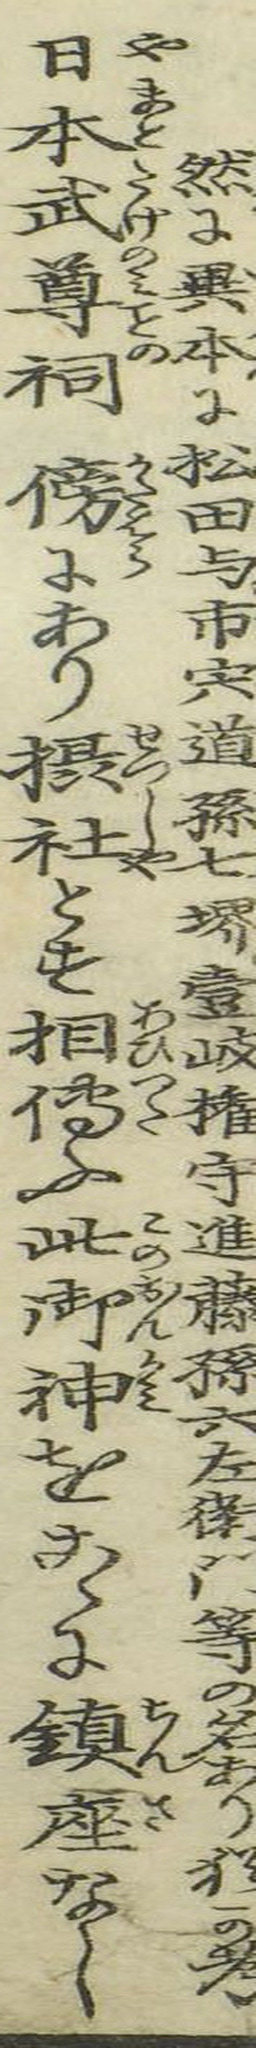日本武尊祠傍にあり摂社とす相傳ふ此御神をこゝに鎮座なし
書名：江戸名所図会 20巻 巻之4
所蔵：東京学芸大学教育コンテンツアーカイブ
